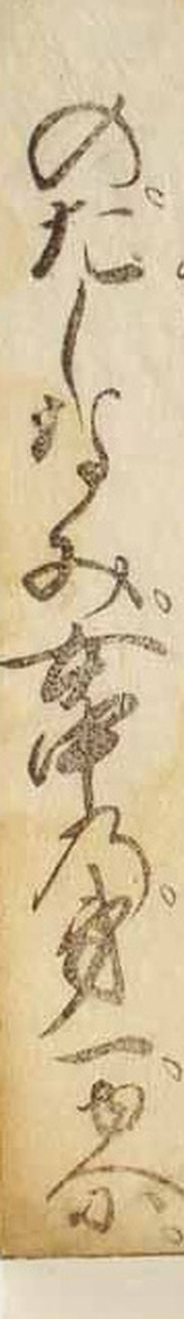の。たしなみ。女中の。第一。ゆへに。

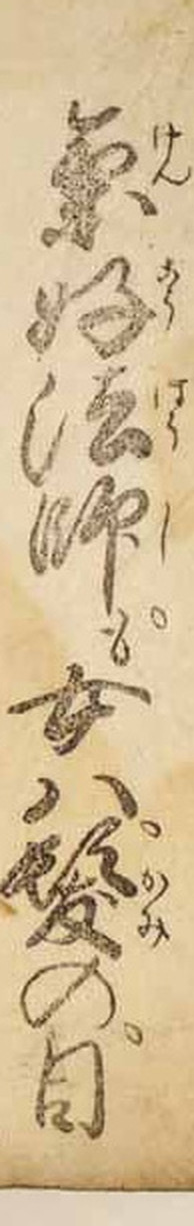兼好法師も。女は。髪の。目
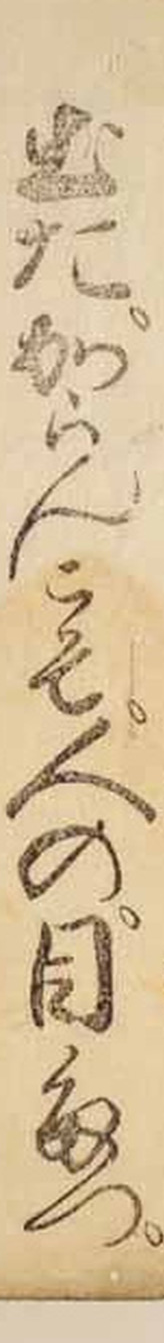出た。からんこそ。人の。目たつ。
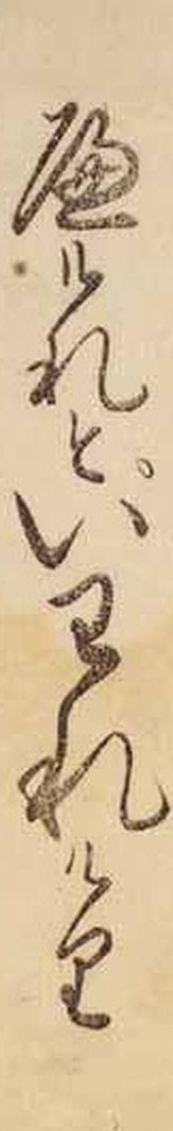へけれと。いわれけり
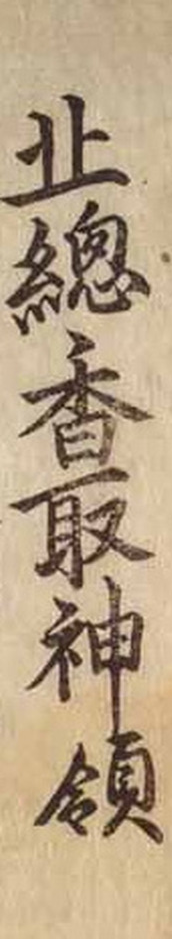北総香取神領
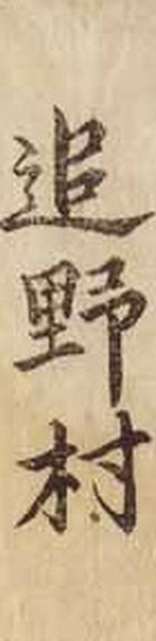追野村
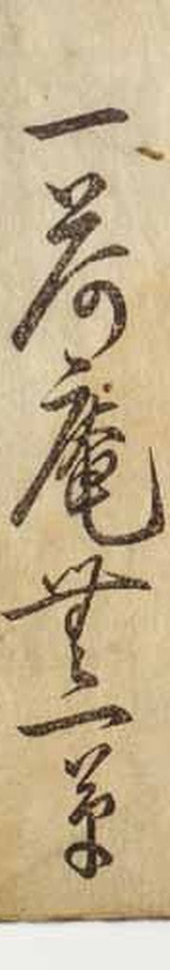一荷庵無一筆
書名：寺子躾方
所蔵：東京学芸大学教育コンテンツアーカイブ
